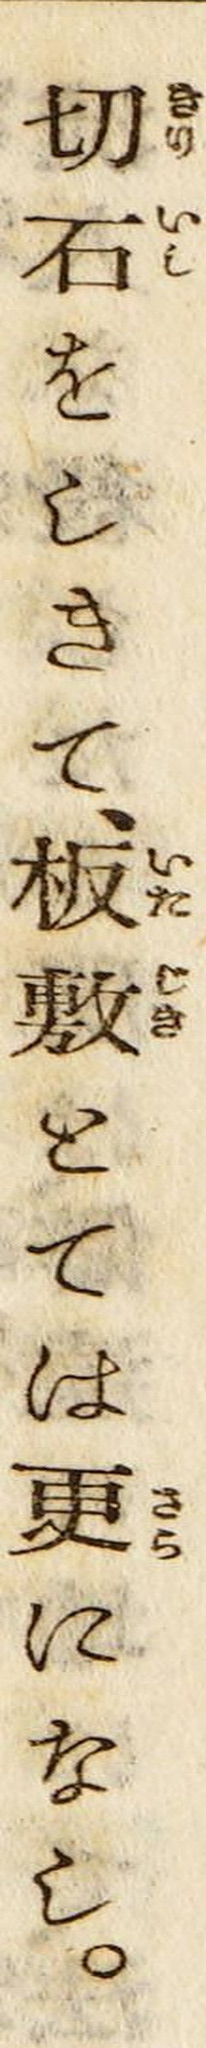切石をしきて、板敷とては更になし。
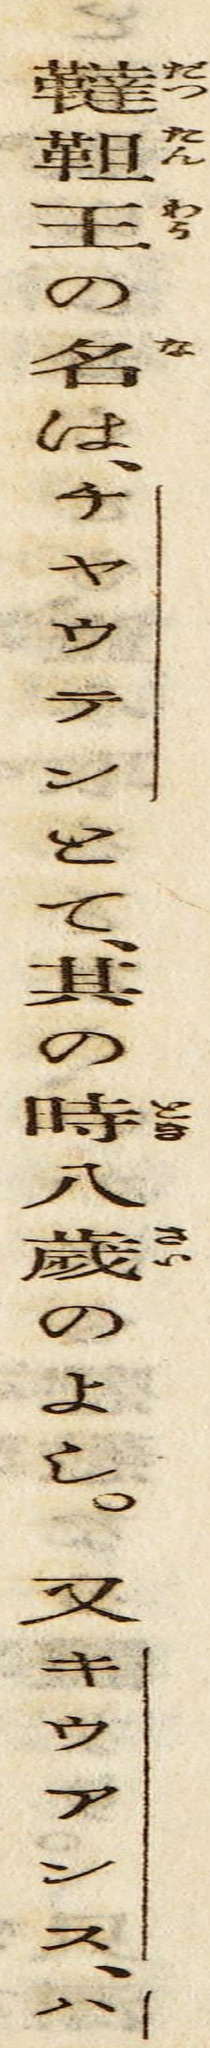韃靼王の名は、チヤウテンとて、其の時八歳のよし。又キウアンス、ハ
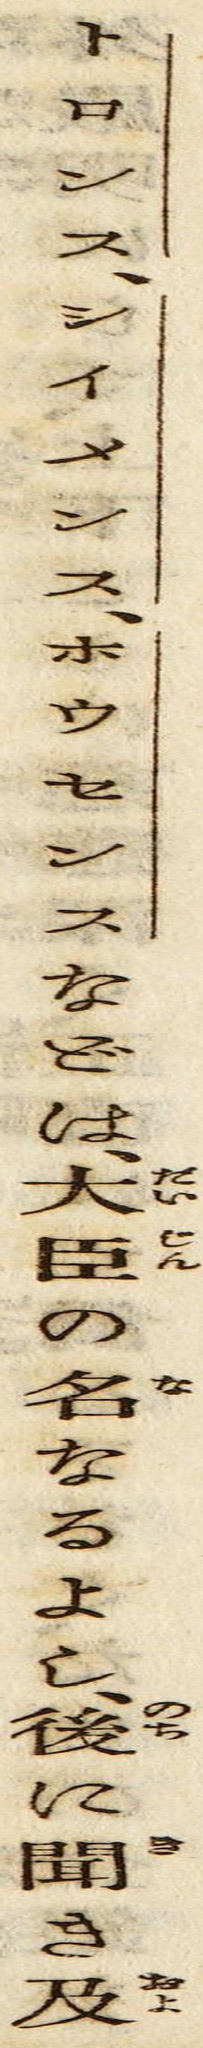トロンス、シイメンス、ホウセンスなどは、大臣の名なるよし、後に聞き及
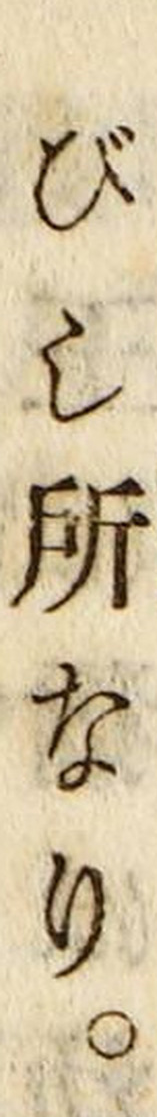びし所なり。

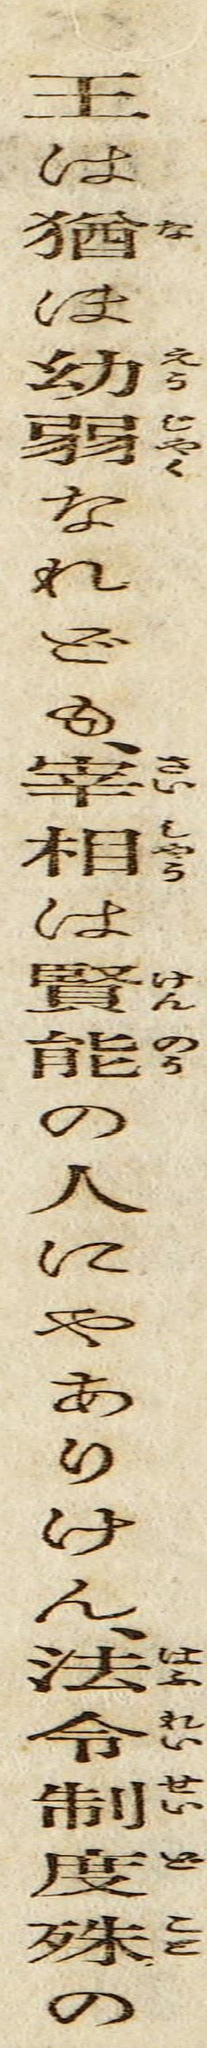王は猶ほ幼弱なれども、宰相は賢能の人にやありけん、法令制度殊の
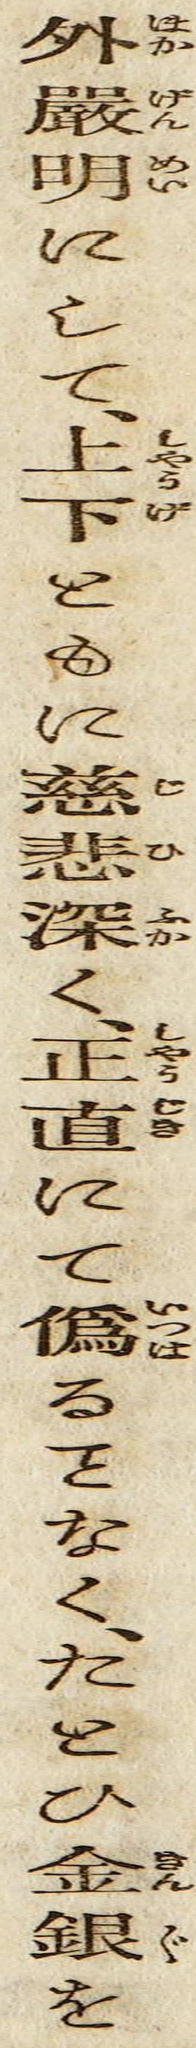外厳明にして、上下ともに慈悲深く、正直にて偽ることなく、たとひ金銀を
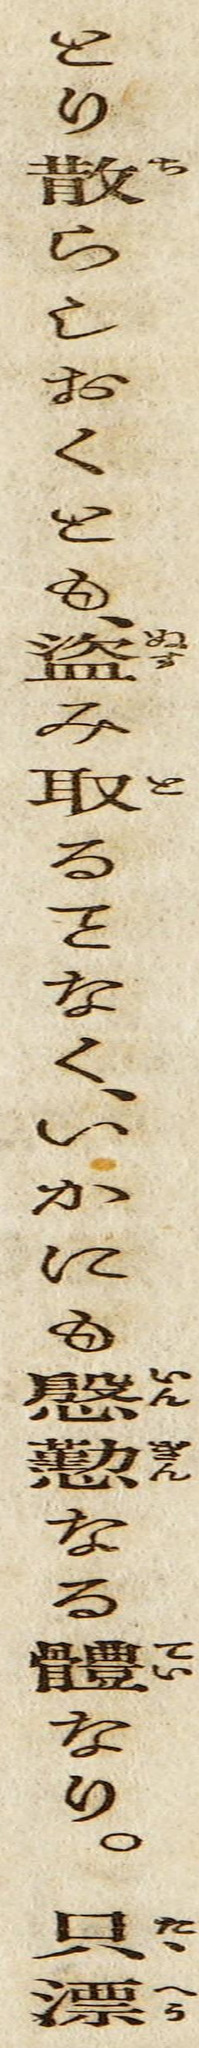とり散らしおくとも、盗み取ることなく、いかにも慇懃なる体なり。只漂
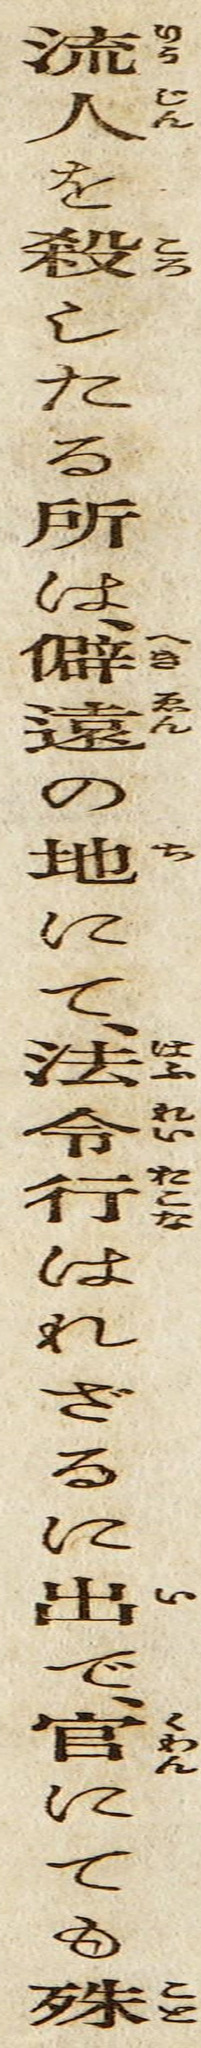流人を殺したる所は、僻遠の地にて、法令行はれざるに出で、官にても殊
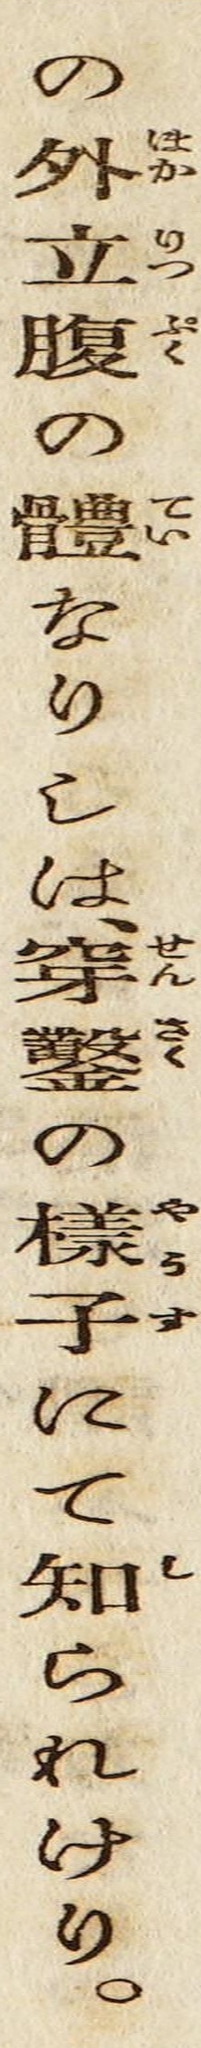の外立腹の体なりしは、穿鑿の様子にて知られけり。
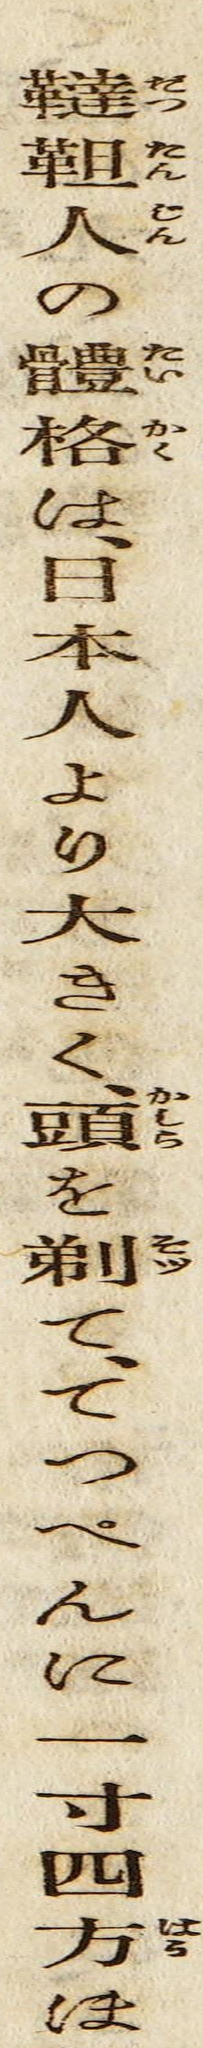韃靼人の体格は、日本人より大きく、頭を剃て、てつぺんに一寸四方ほ
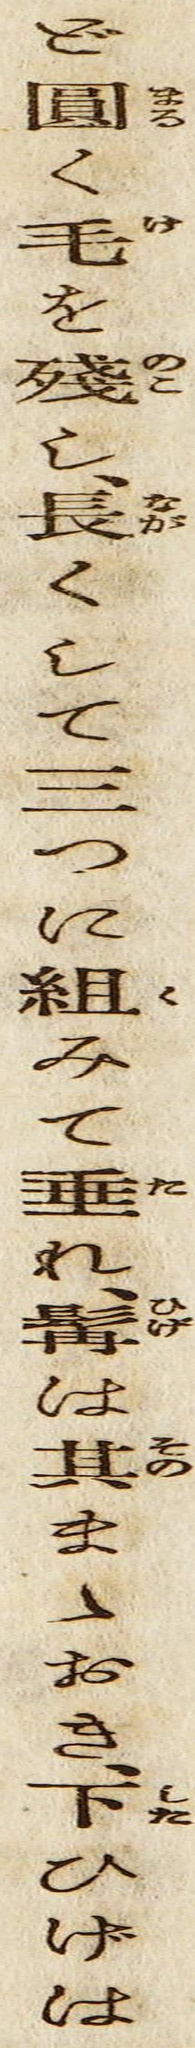ど円く毛を残し、長くして三つに組みて垂れ、髥は其まゝおき、下ひげは
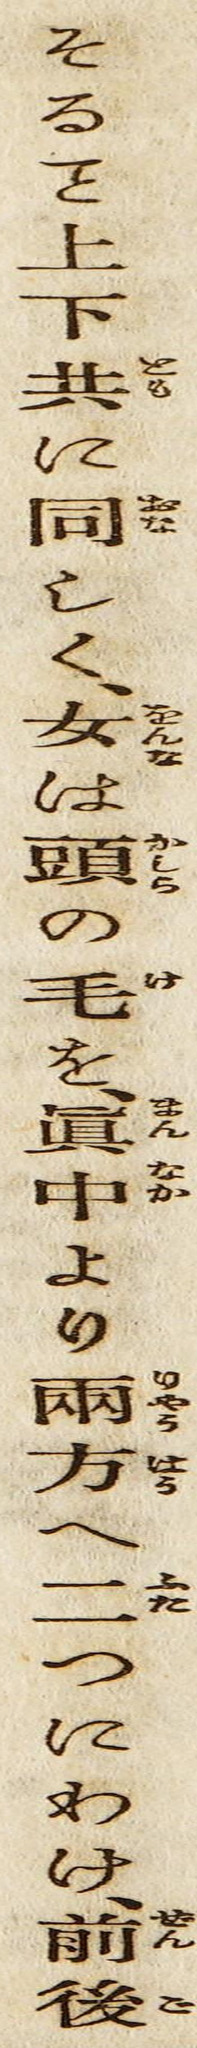そること上下共に同しく、女は頭の毛を、真中より両方へ二つにわけ、前後
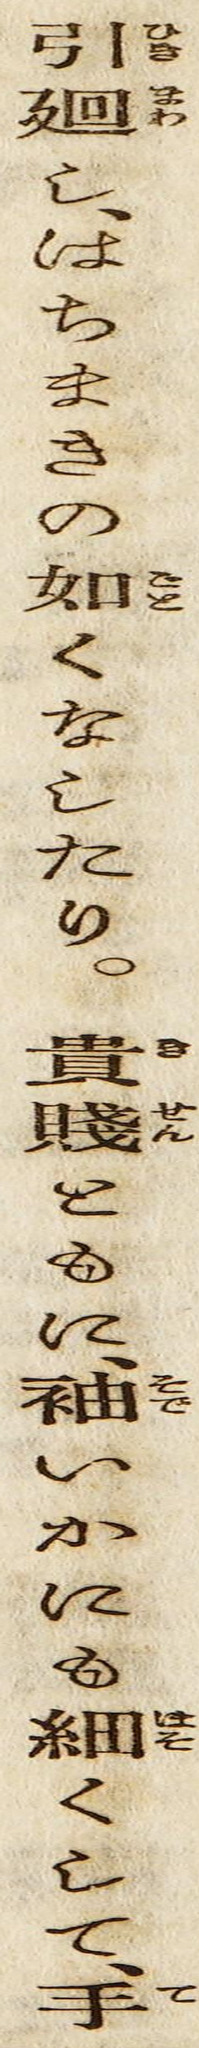引廻し、はちまきの如くなしたり。貴賤ともに、袖いかにも細くして、手
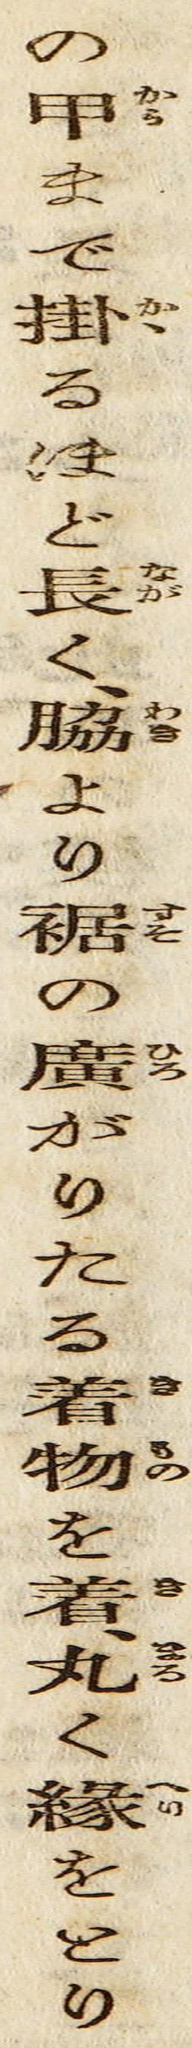の甲まで掛るほど長く、脇より裾の広がりたる着物を着、丸く縁をとり
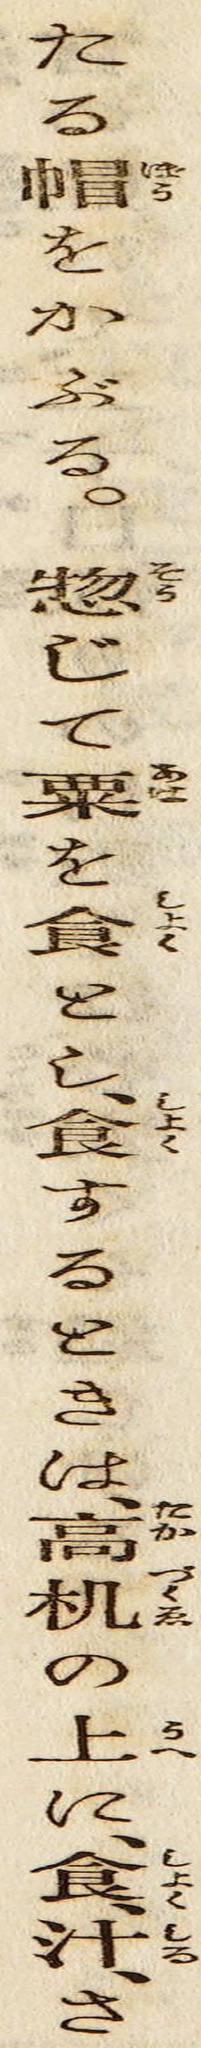たる帽をかぶる。総じて粟を食とし、食するときは、高机の上に、食、汁、さ
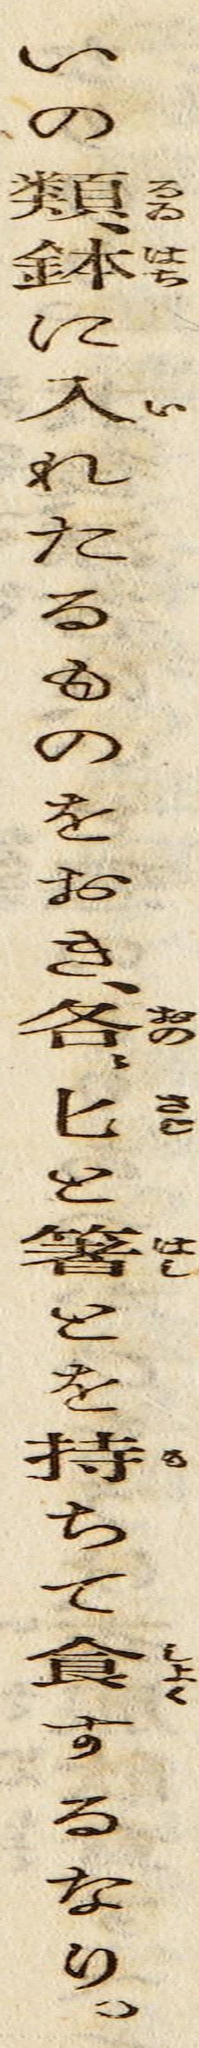いの類、鉢に入れたるものをおき、各〻匕と箸とを持ちて食するなり。
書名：日本漂流譚
